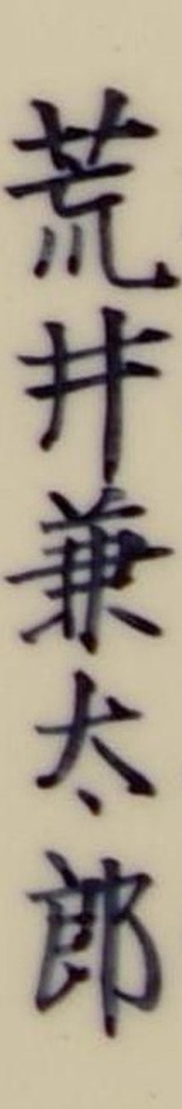荒井兼太郎
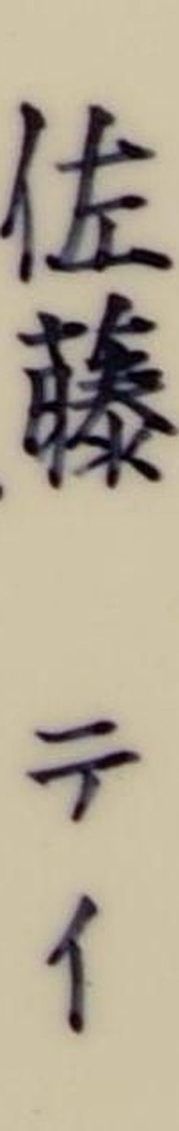佐藤テイ
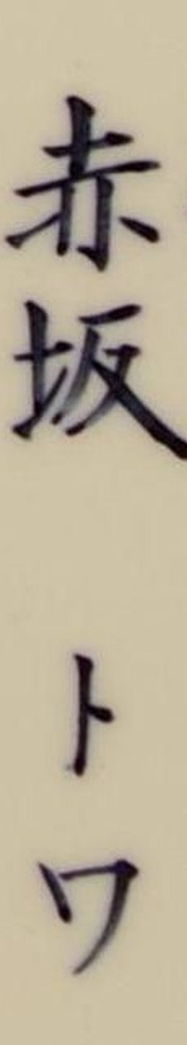赤坂トワ
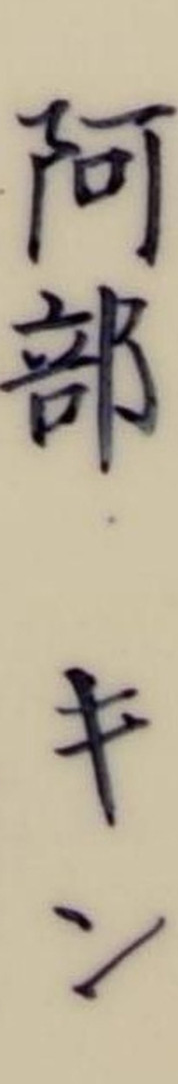阿部キン
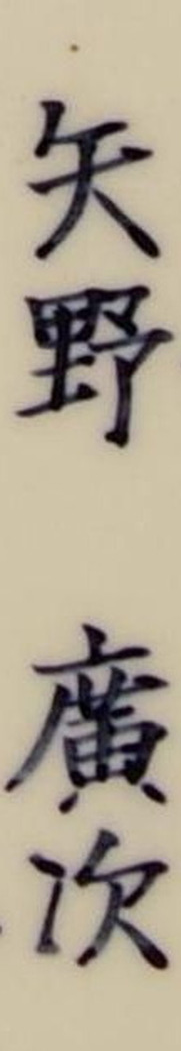矢野廣次
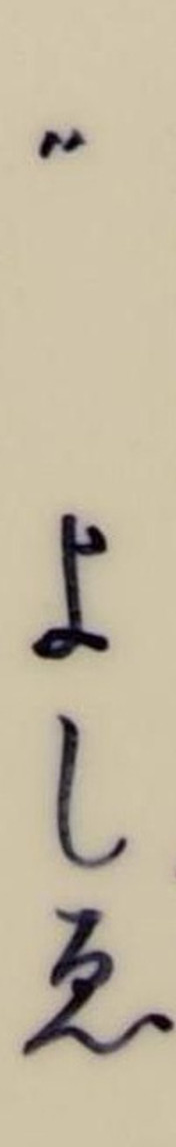よしえ
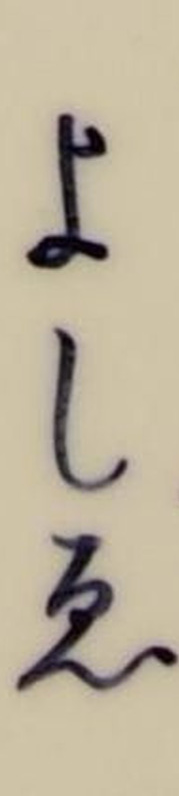よしえ
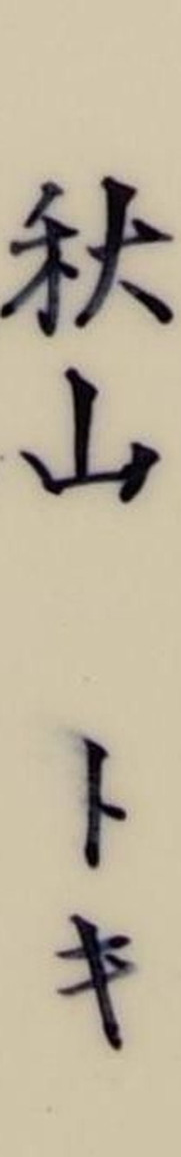秋山トキ
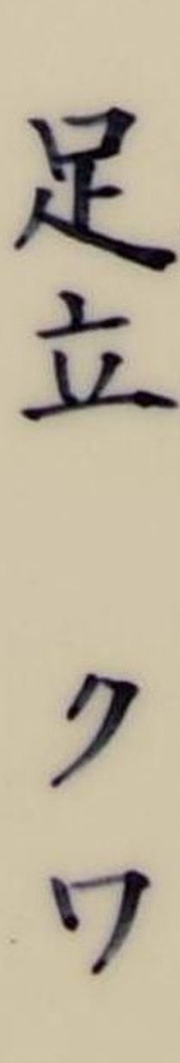足立クワ
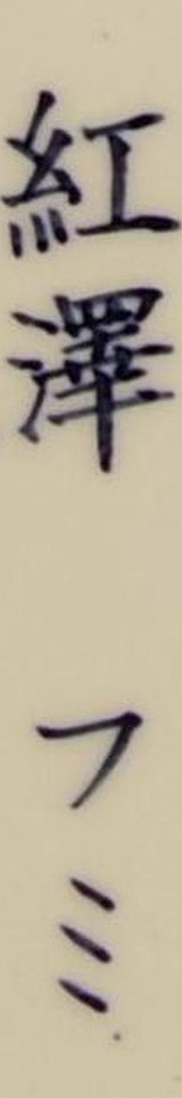紅澤フミ
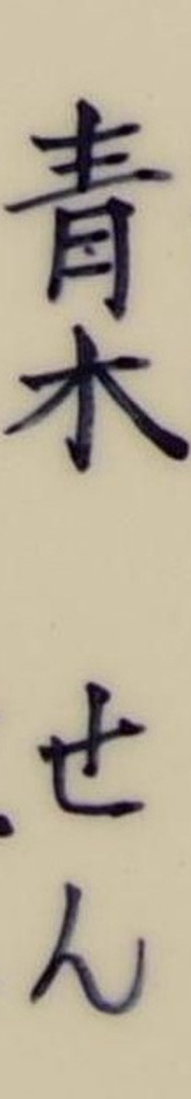青木せん
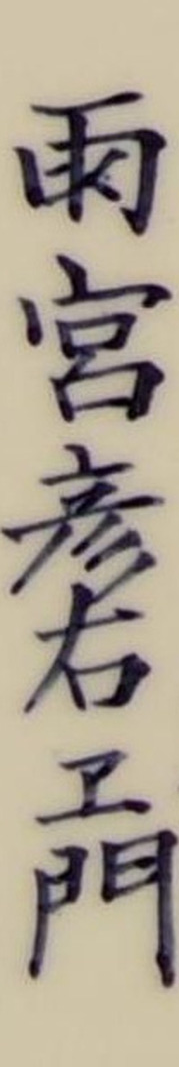雨宮彦右ヱ門
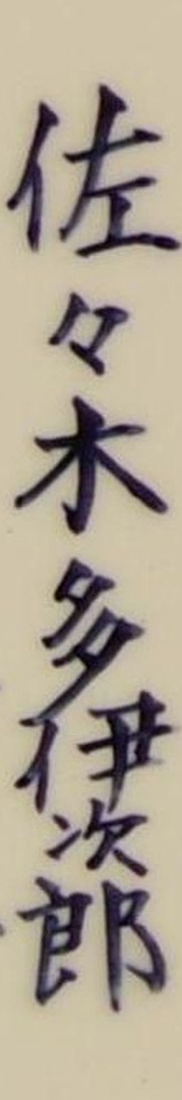佐々木多伊次郎
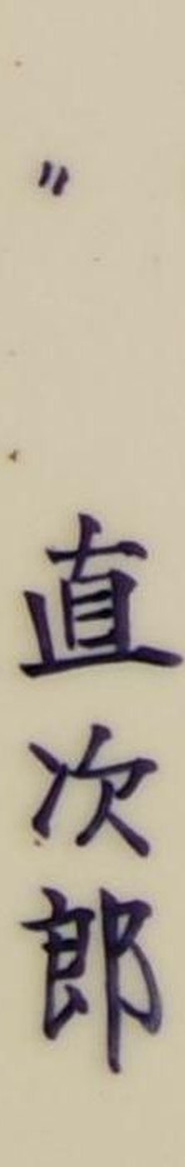直次郎
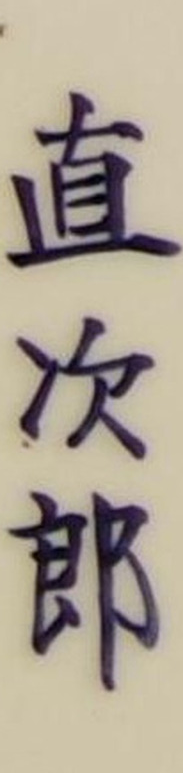直次郎
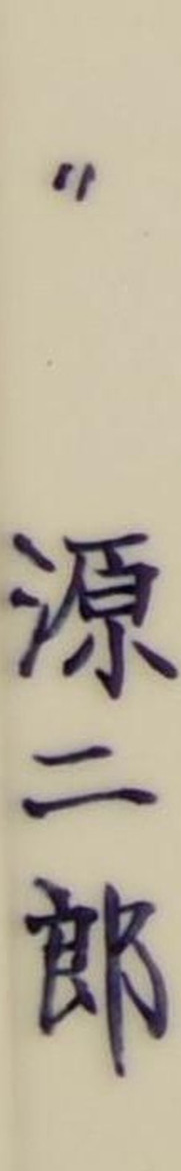源二郎
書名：E~L
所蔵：高野山金剛峯寺
